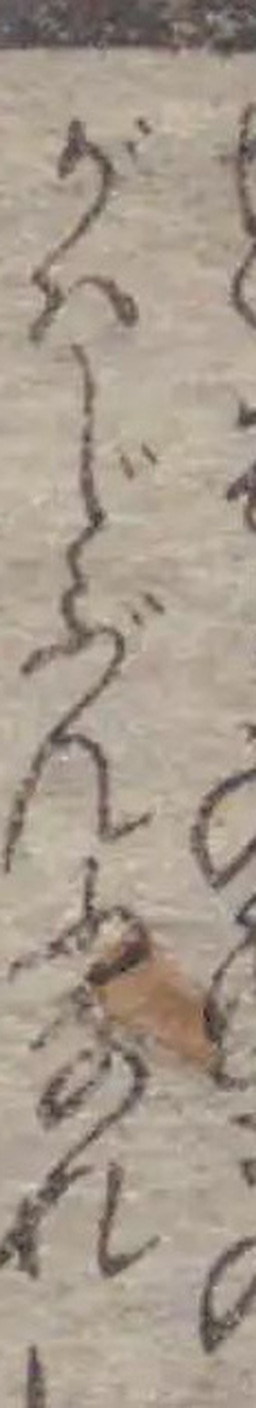がはじぶんになれ
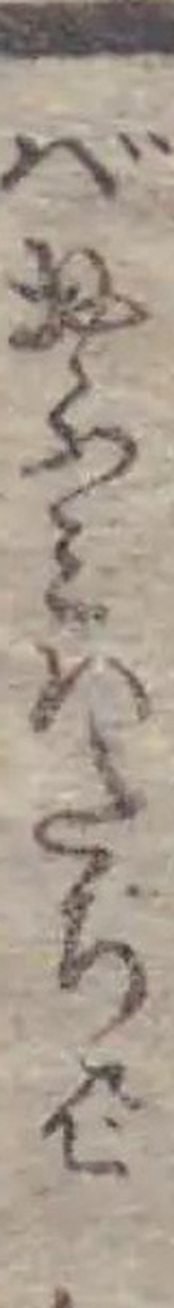ばおふみはたちば
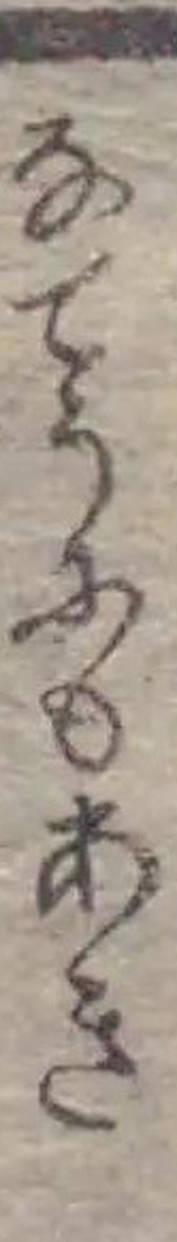なてふにもあき
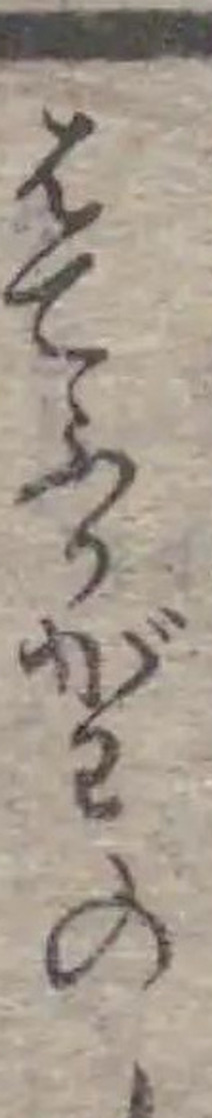はてふかがわの
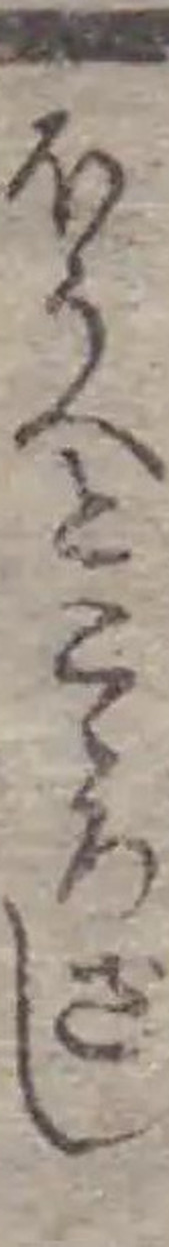ほうへとこゝろさし
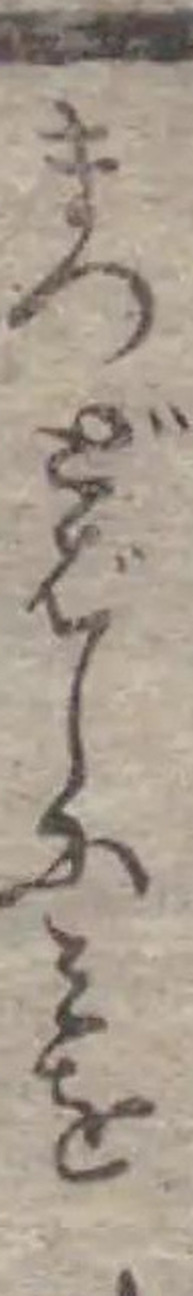まつどばしにみを
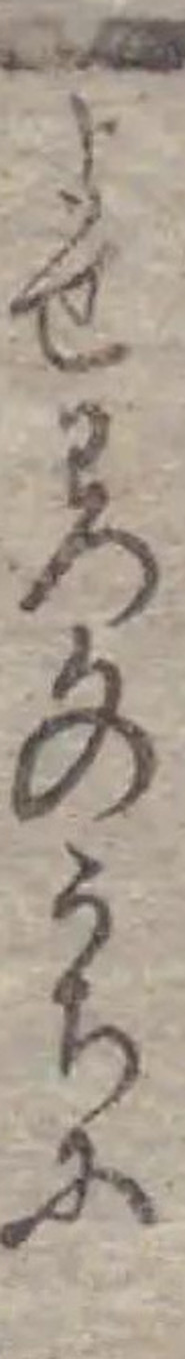よせわつかのうちに
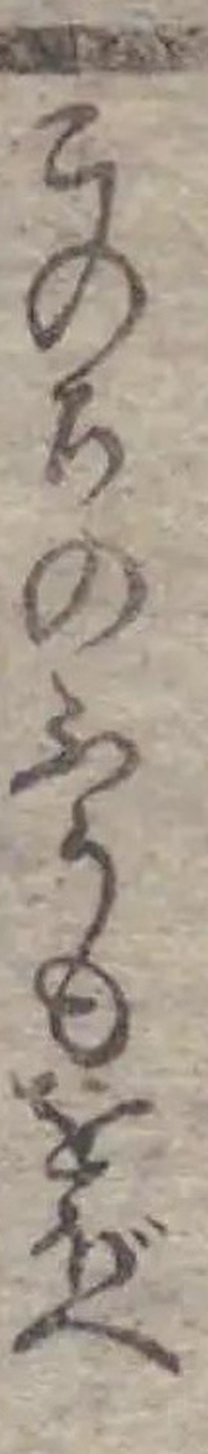このちのふりもをぼへ
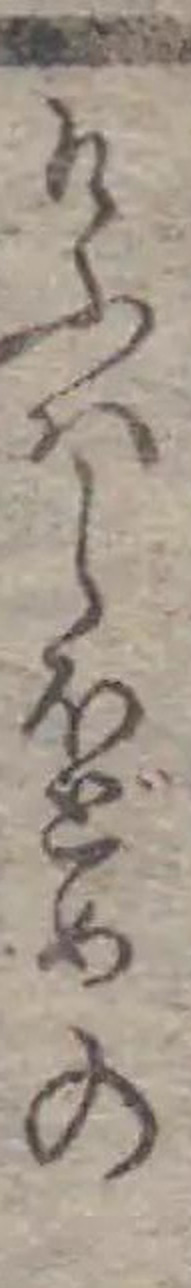けふはしほどめの
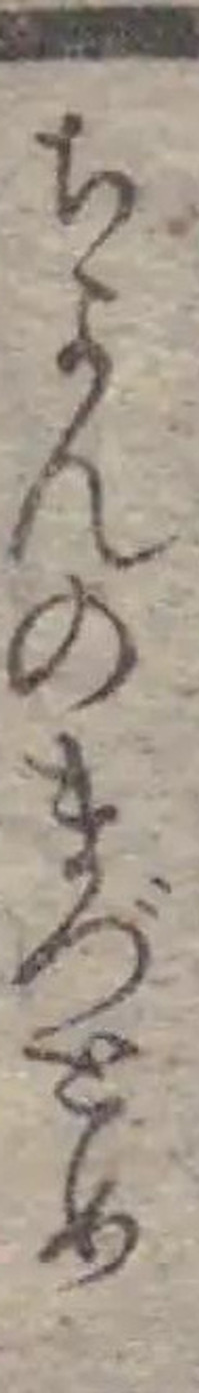ちよんのまづとめ
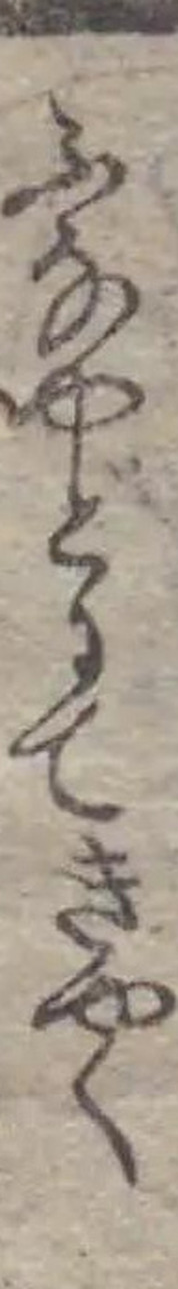ふなやどにてきやく
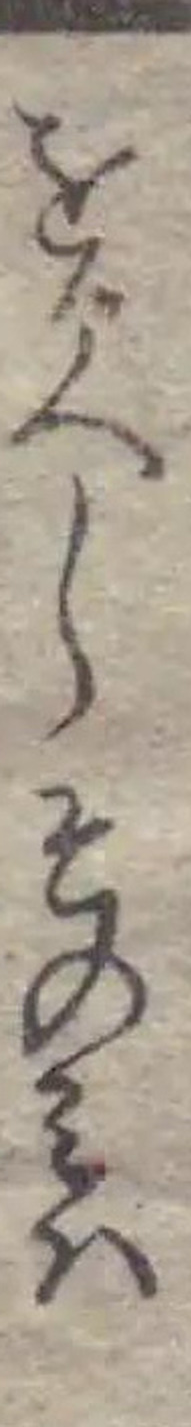をかへしそのみは
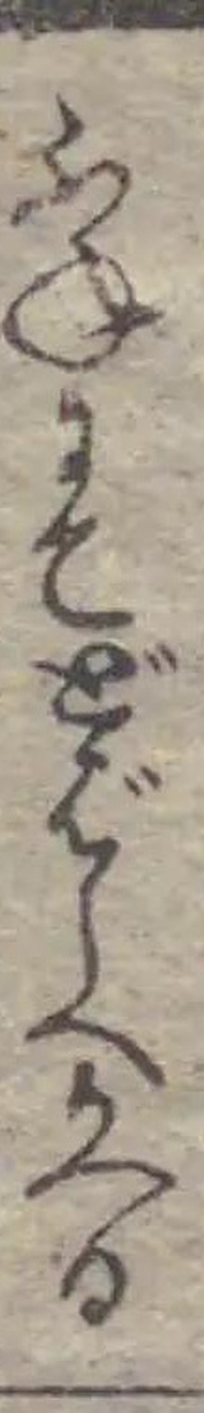ふねにてどばしへかへる
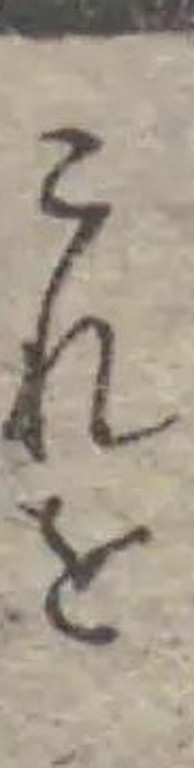これを
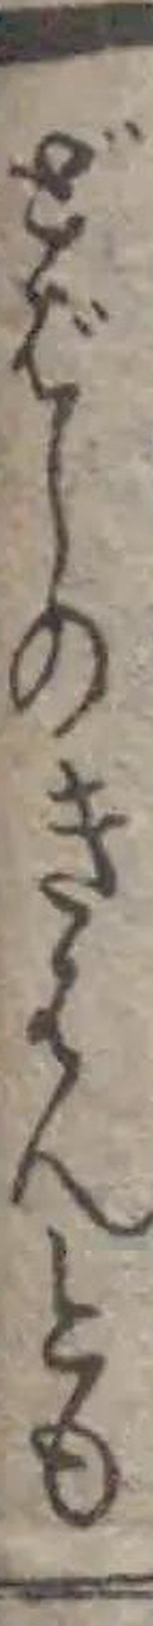どばしのきわんとも
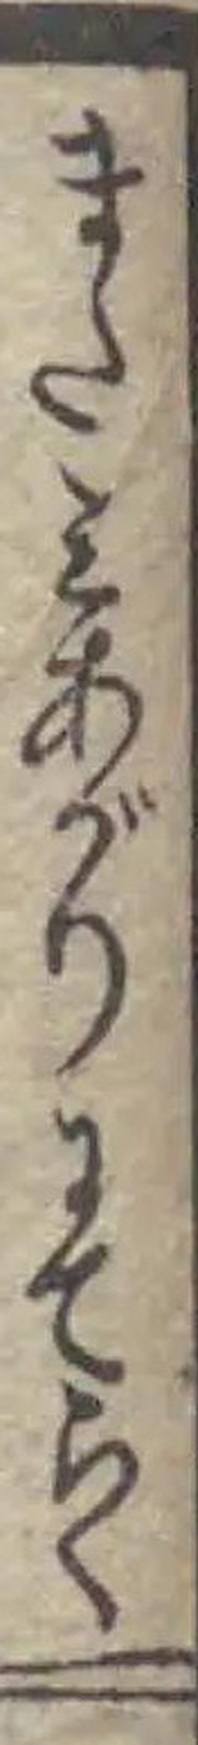またみあがりにてらく
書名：かんなんの夢枕 2巻
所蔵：国立国会図書館 National Diet Library, JAPAN
